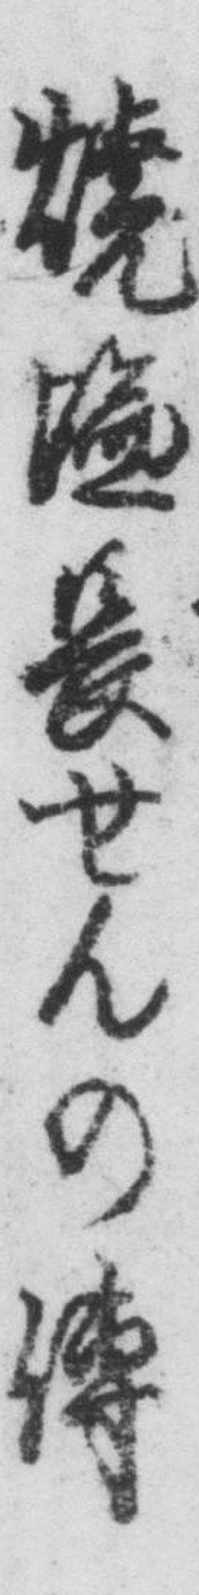焼塩長せんの傳
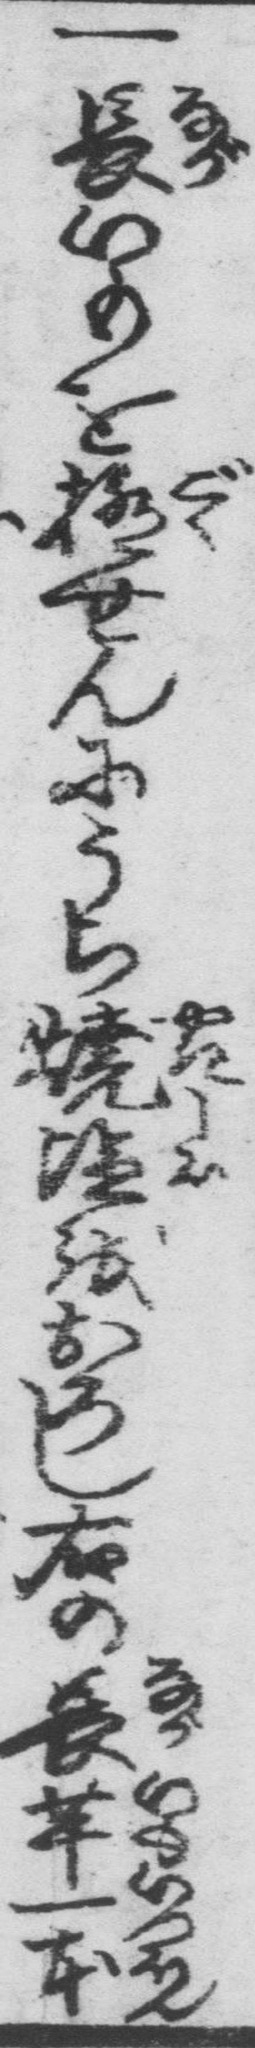一長のりを極せんにうち焼塩をおろし右の長芋一本
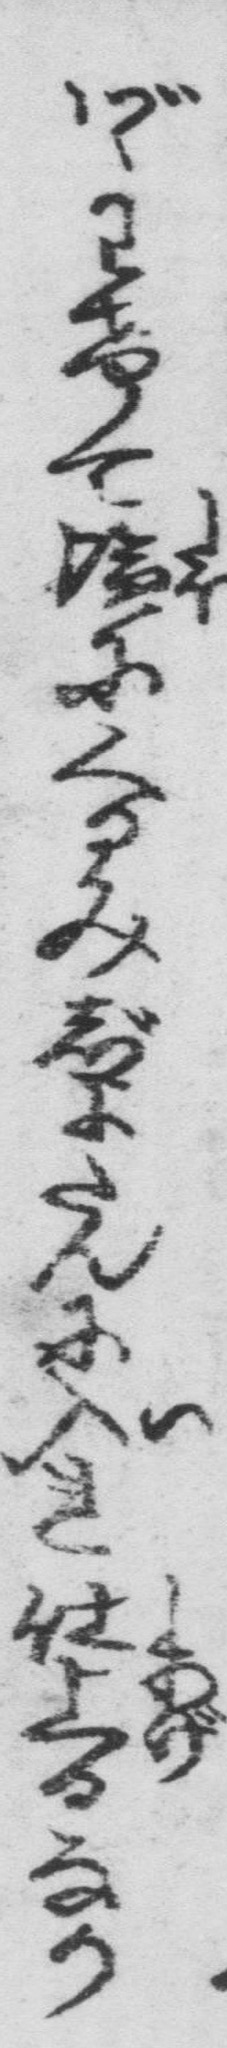づゝわりて塩にくるみじよたんに入れ仕上るなり
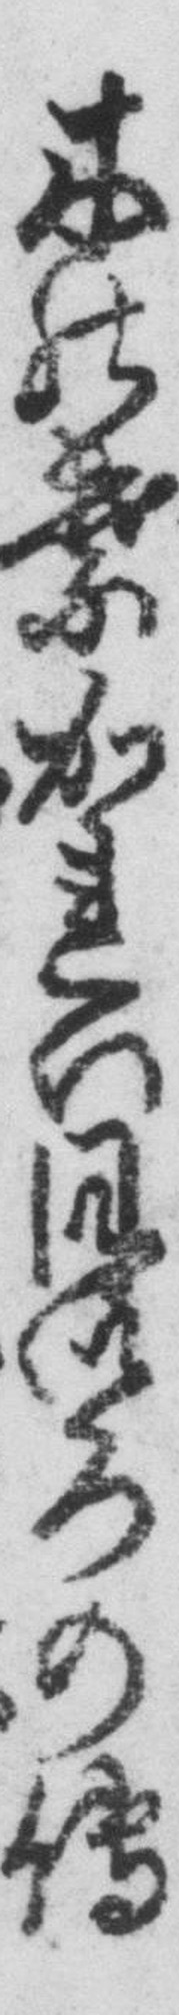木の葉かれいほいろの傳
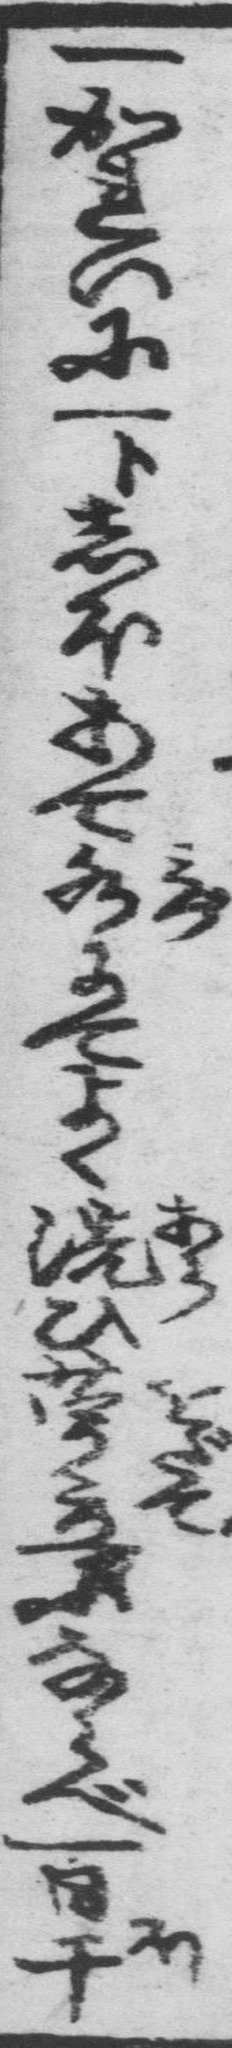一かれいに一トしほあて水にてよくあらひ苧立ならべ一日干
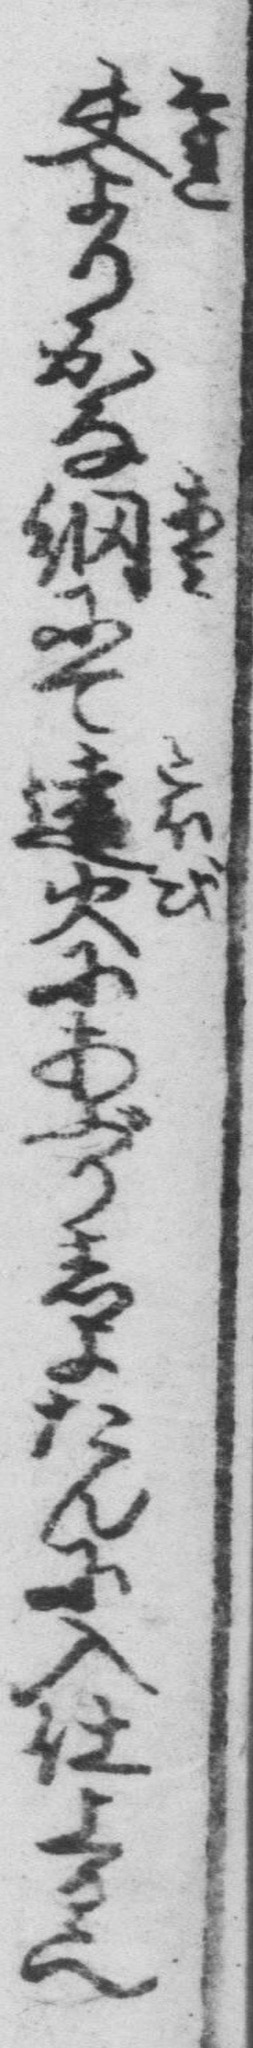夫よりかな網にて遠火にてあぶりしよたんに入仕上る也
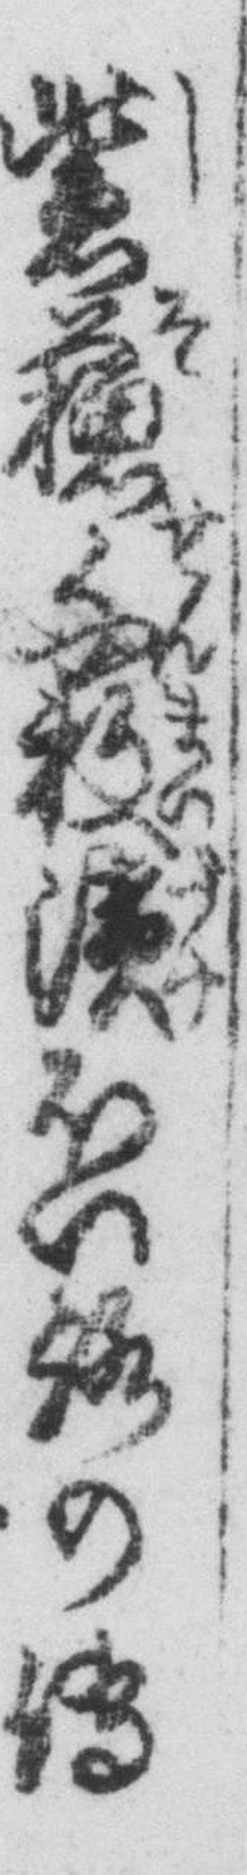紫蘇千枚漬ほいろの傳
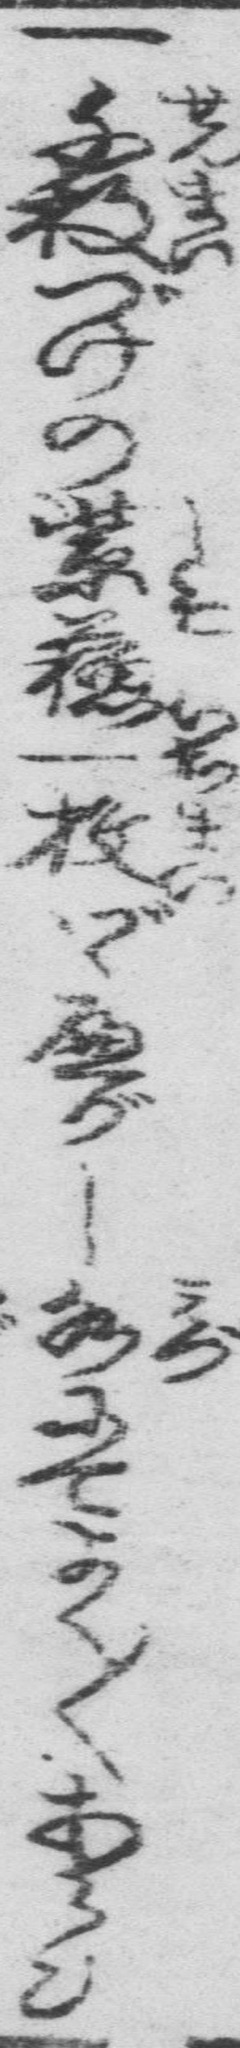一千枚づけの紫蘇一枚づゝがし水にてよく〳〵あらひ
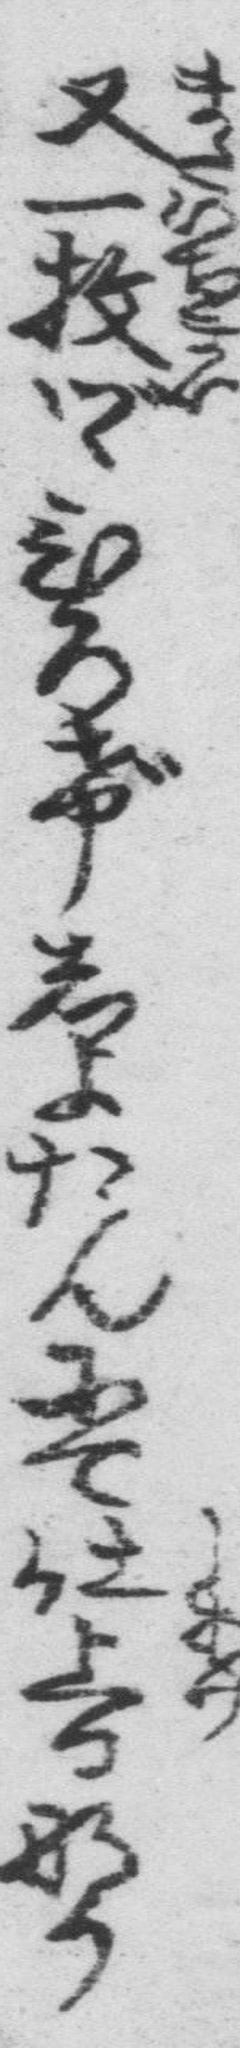又一枚づゝひろげしよたんにて仕上る也
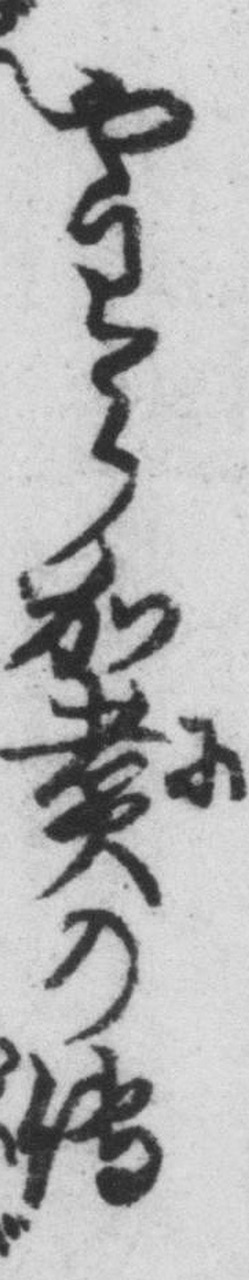やわらか煮の傳
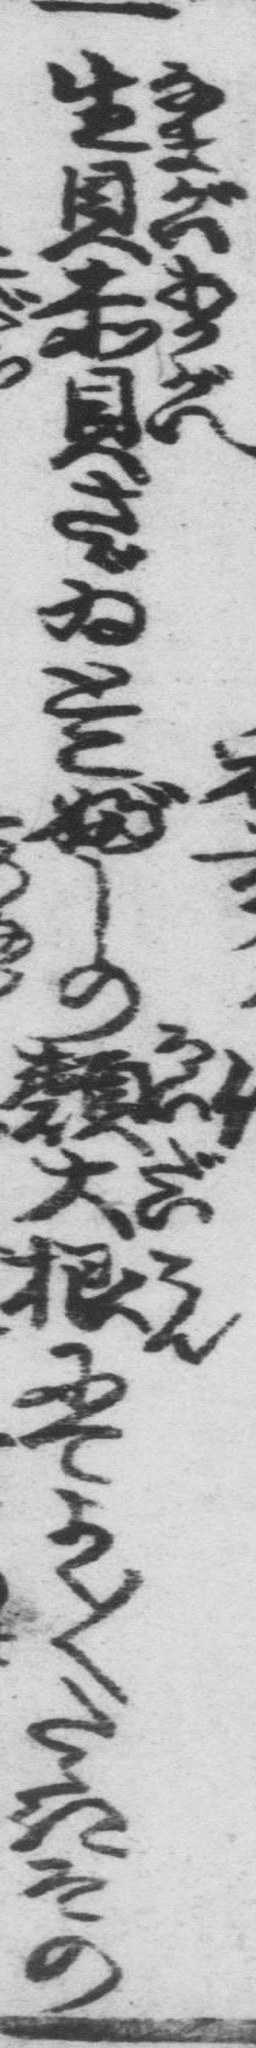一生会赤貝さゞゐとこぶしの塁大根にてよく〳〵たゝきその
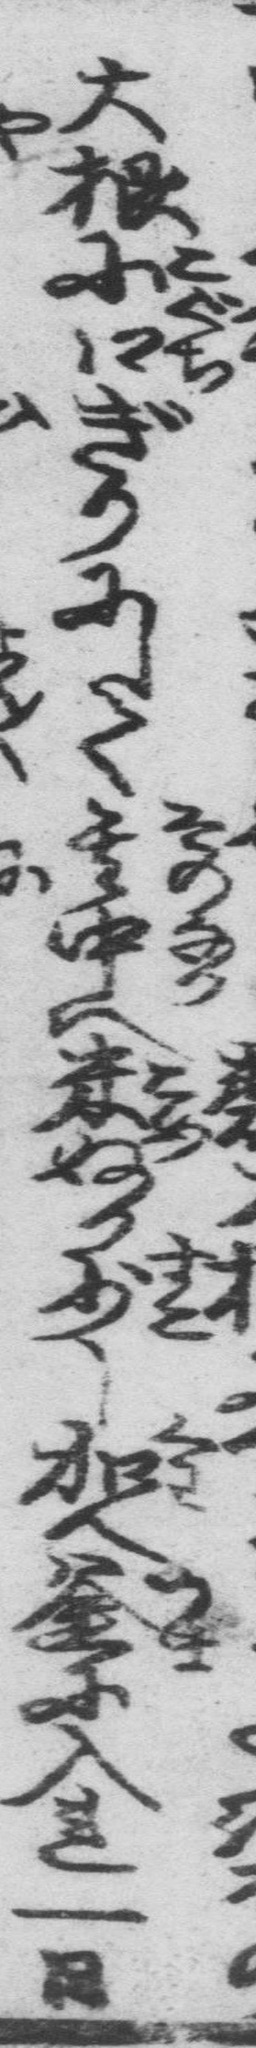大根小口ぎりにたて其中へ米ぬか少し釜に入れ一日
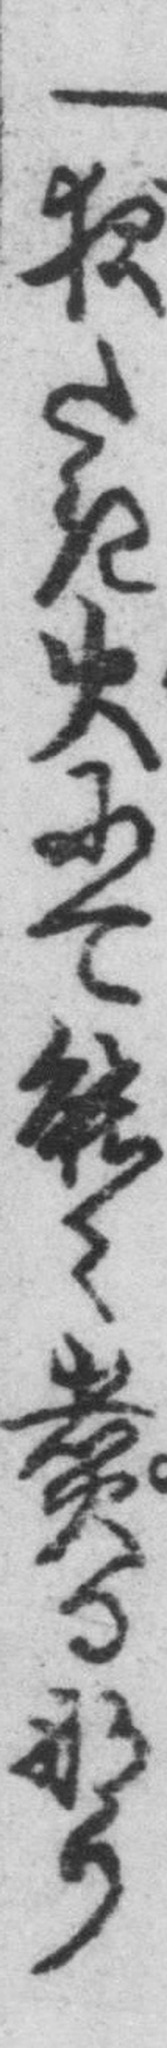一夜たき火にて能々煮るななり
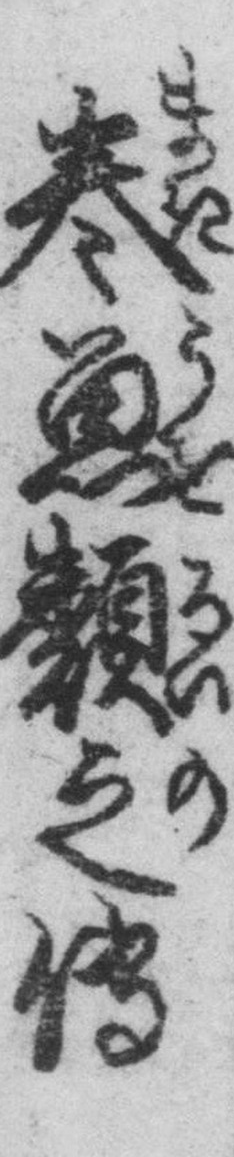巻魚類之傳

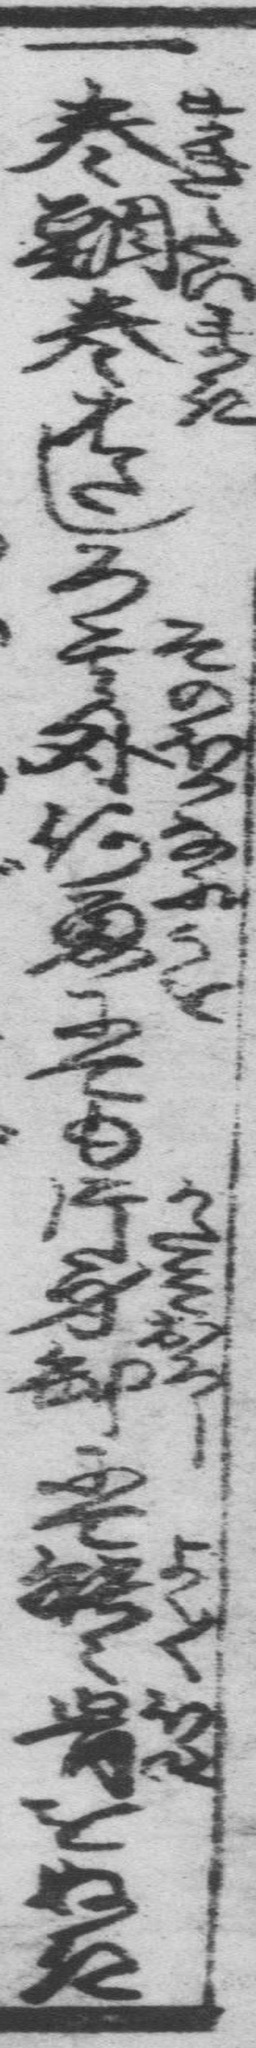一巻鯛巻はたしろ其外何魚にても片身卸にて骨をぬき
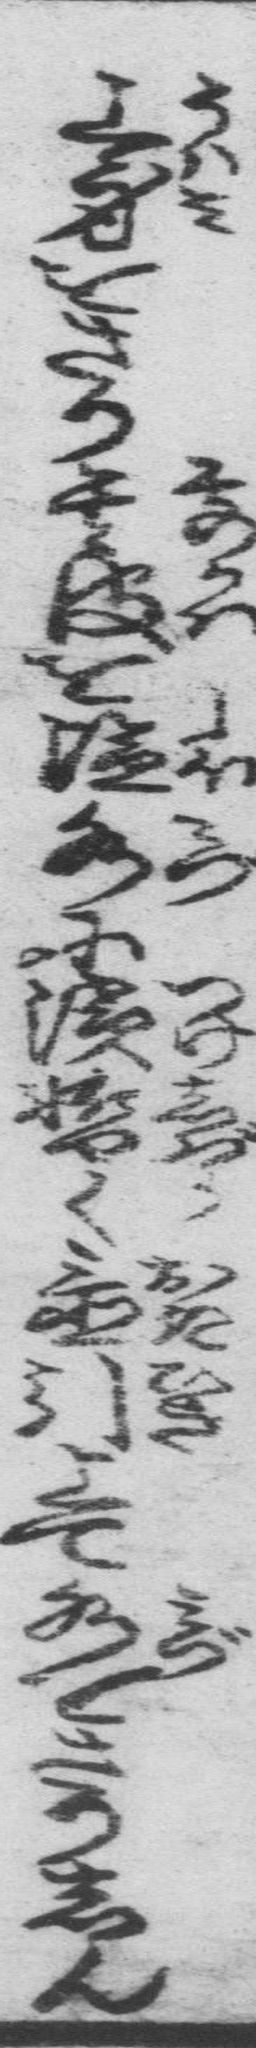上身をさり其皮を塩水に漬しばらく置引き上て水をさりじん
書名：即席庖丁
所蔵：大阪府立大学学術情報センター 国文学研究資料館
